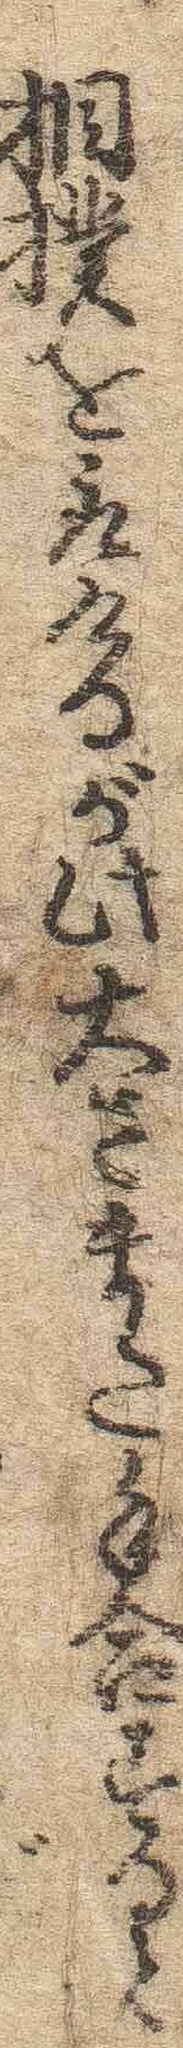相撲を取けるが此大さまた手合すると
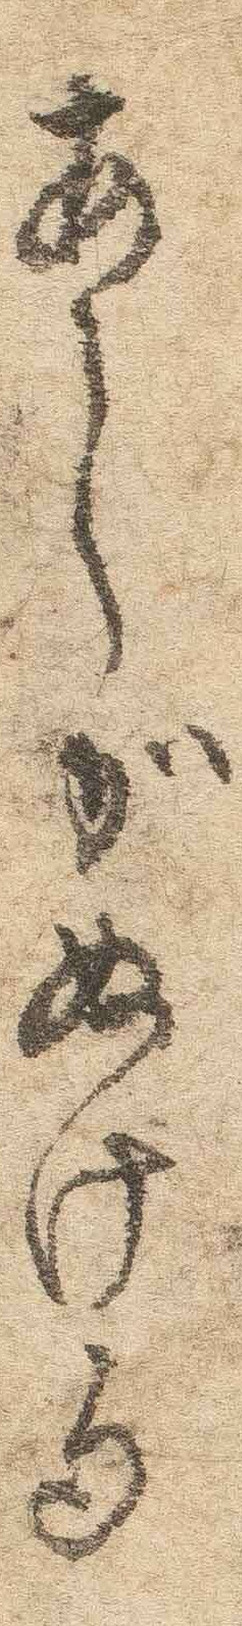あしがぬける
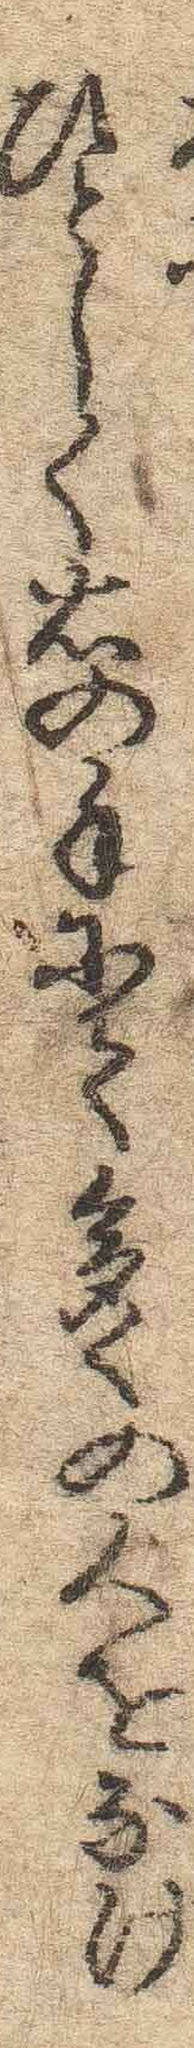ひとしく右の手にて多くの人をなげ
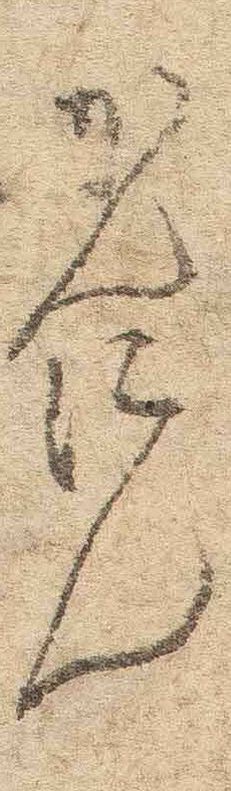かんにん
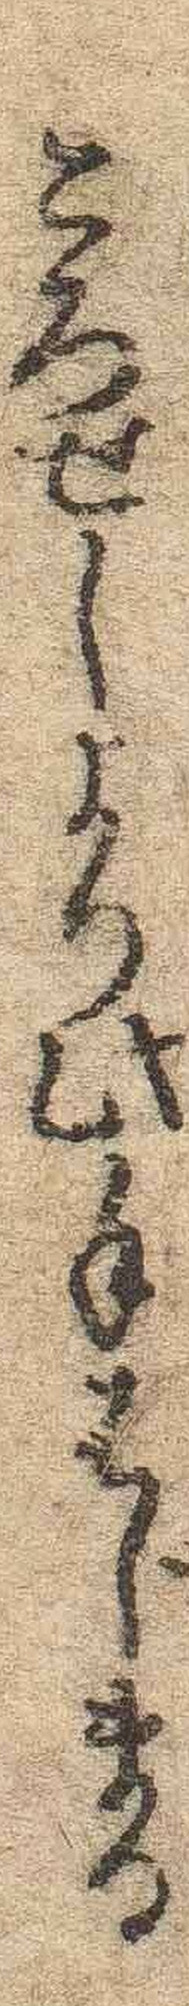ころせしより此手はじまる

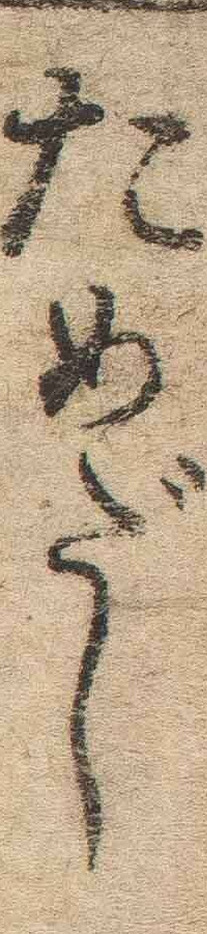ためだし
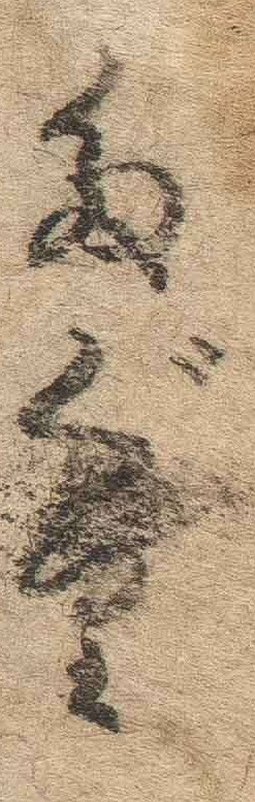たぐり
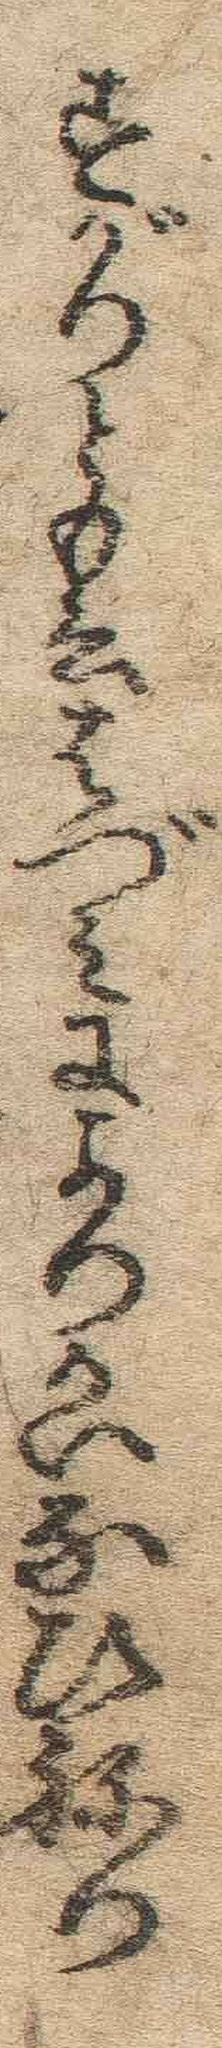すがりとも云はづみによりかいなひねり
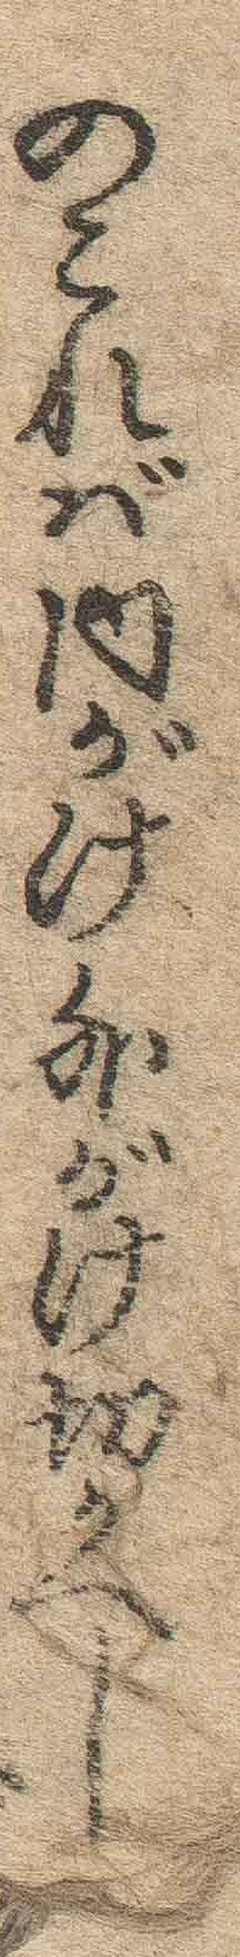のこれば内がけ外がけ切かへし
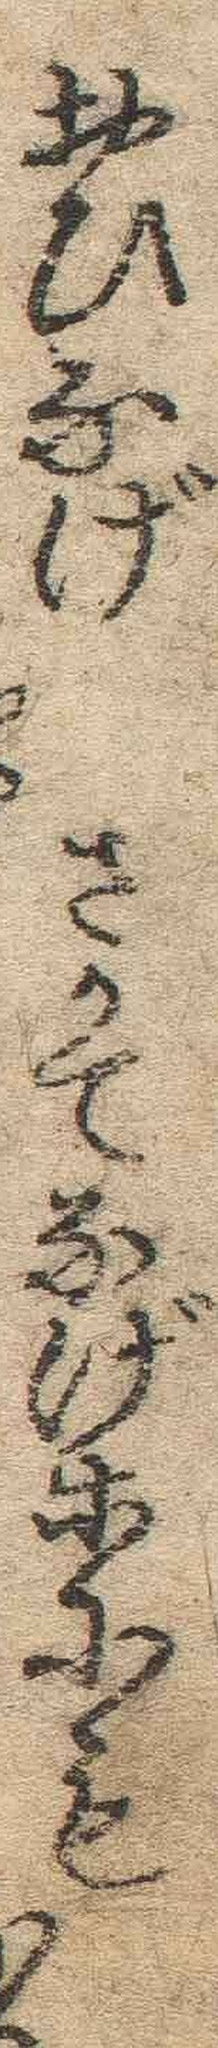おひなげさかてなげ等にもなる
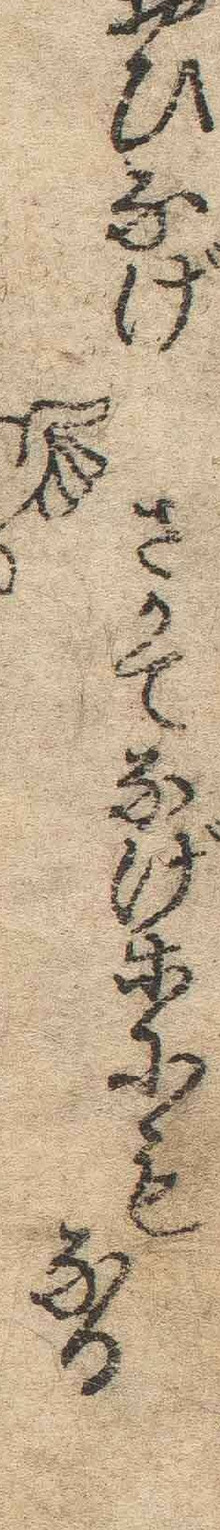おひなげさかてなげ等にもなる
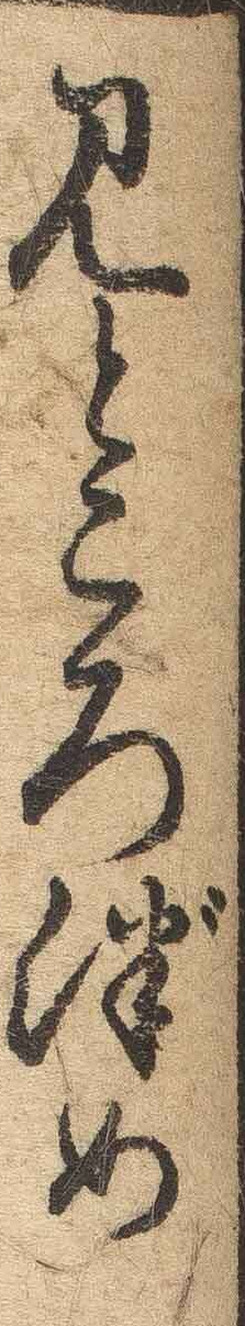見ところずめ
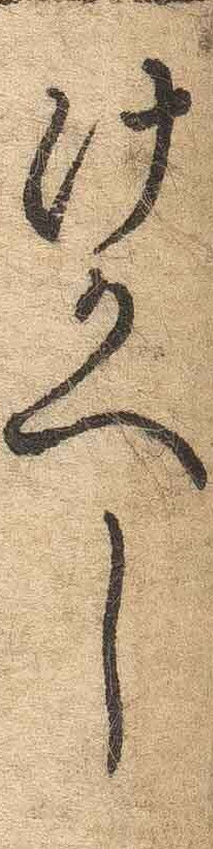けかへし
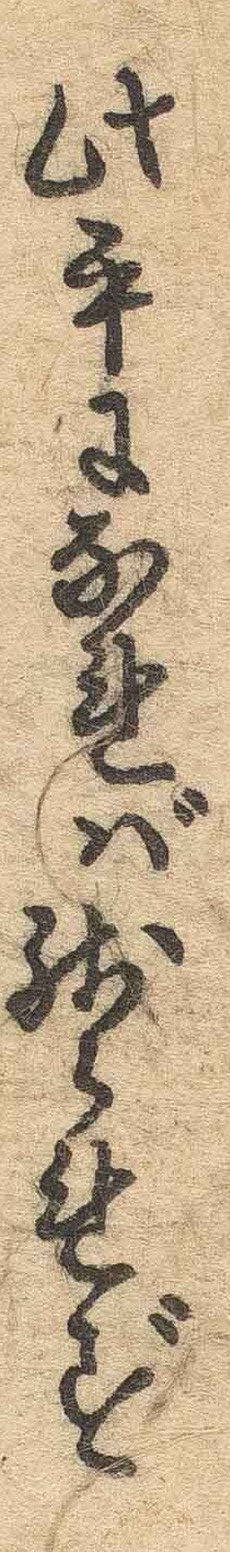此手になれば残られず
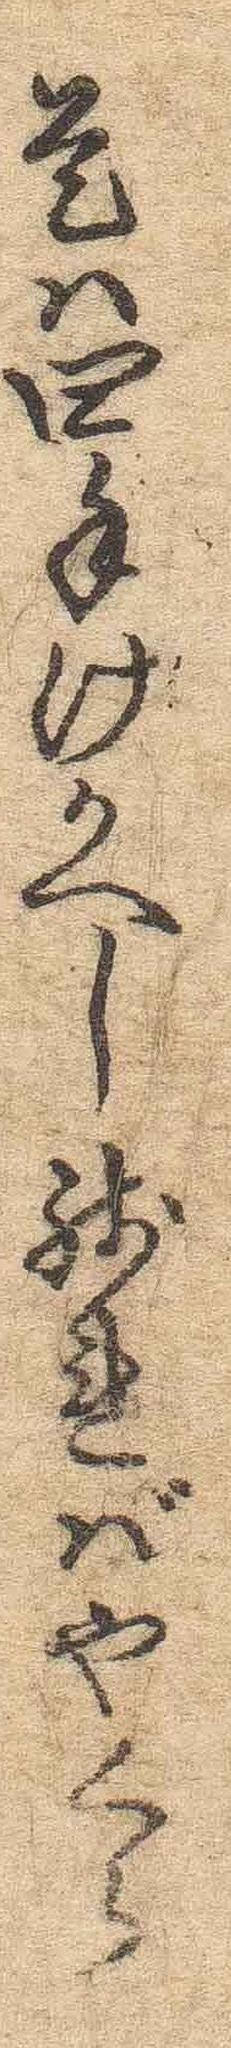是は四てけかへし残ればやぐら

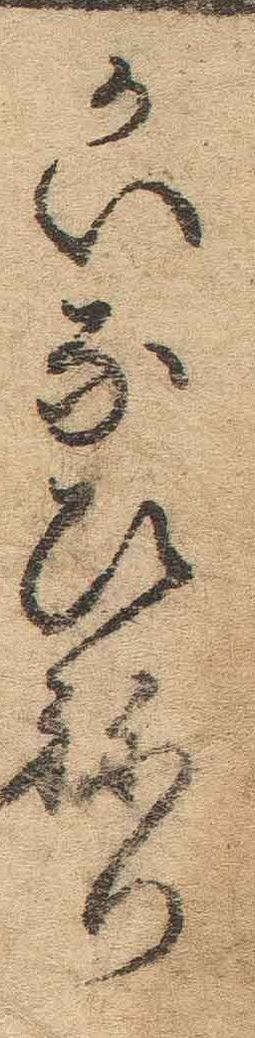かいなひねり
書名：古今相撲大全
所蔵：東京学芸大学附属図書館 国文学研究資料館
